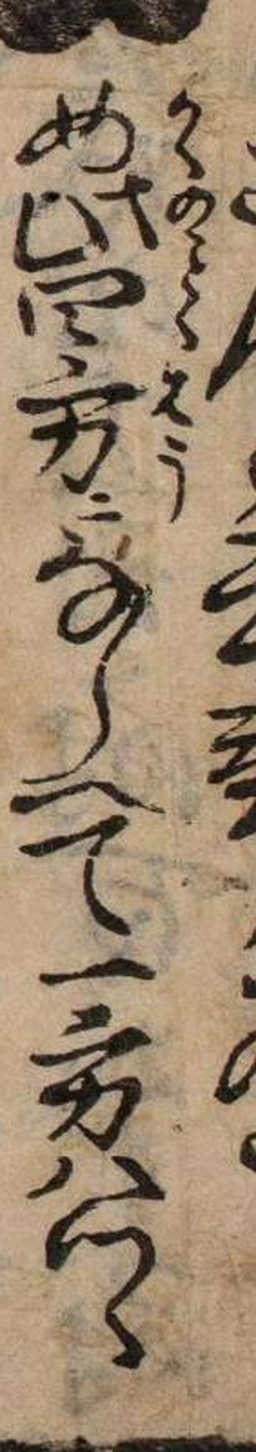如此四方にならへて一方八つゝ
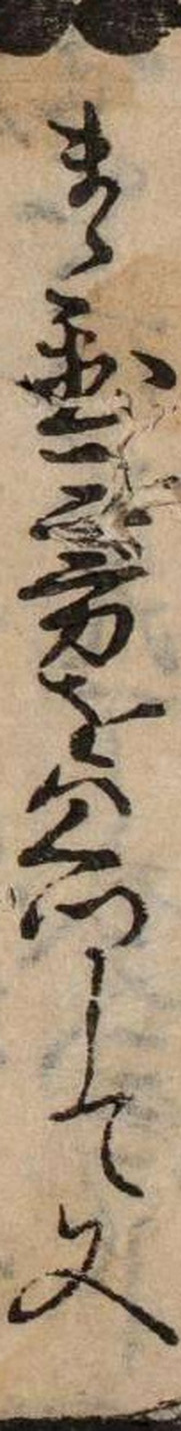まゝ置三方をはくつして又
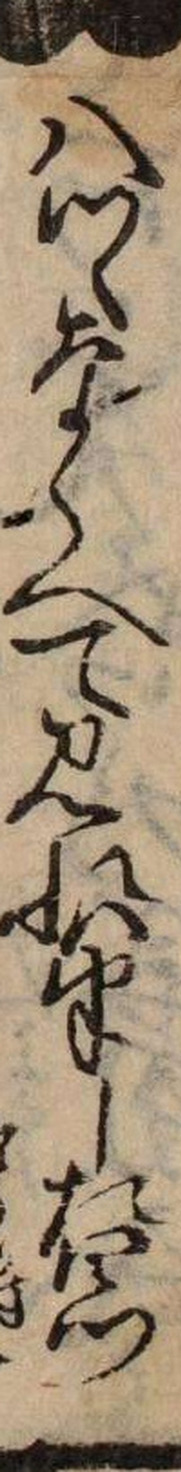八つゝならへて見れは半した四つ
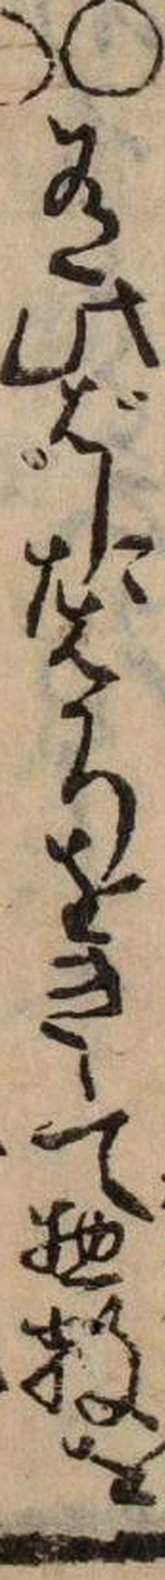有此ばしたはかりをきて惣数を云也
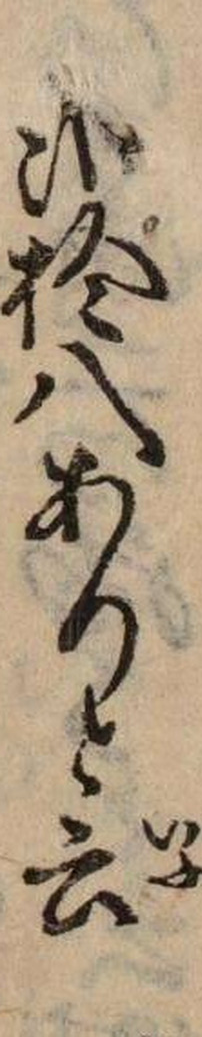弐拾八ありと云
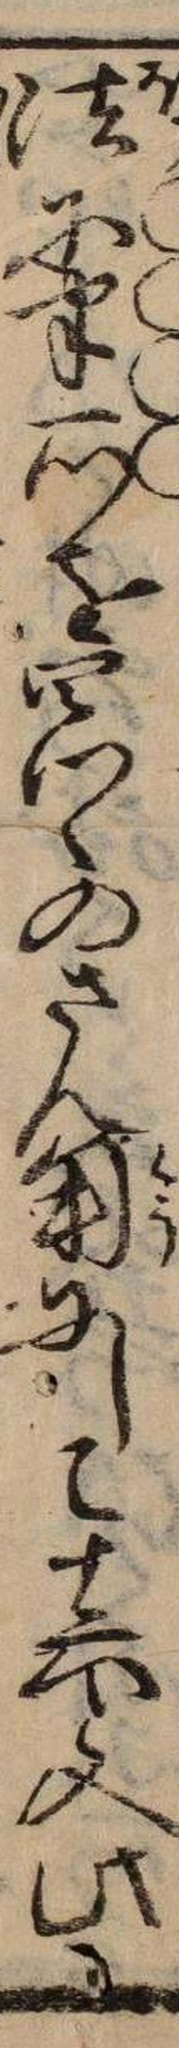法に半一つを四つゝのさん用にして十六と又此
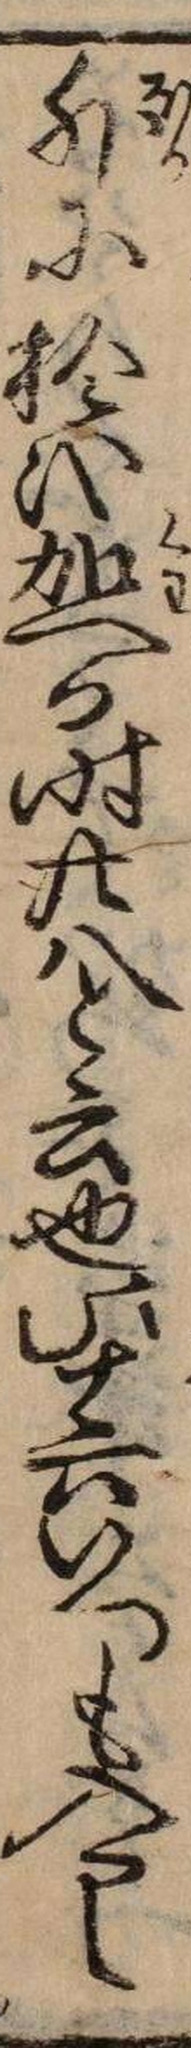外に拾弐加へる時廿八と云也此十六いつも入申
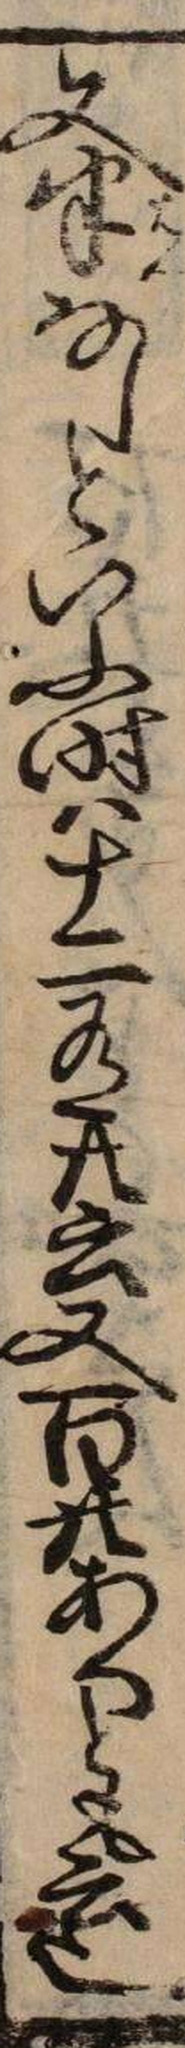又半なしといふ時は十二有共云又百共ありとも云也
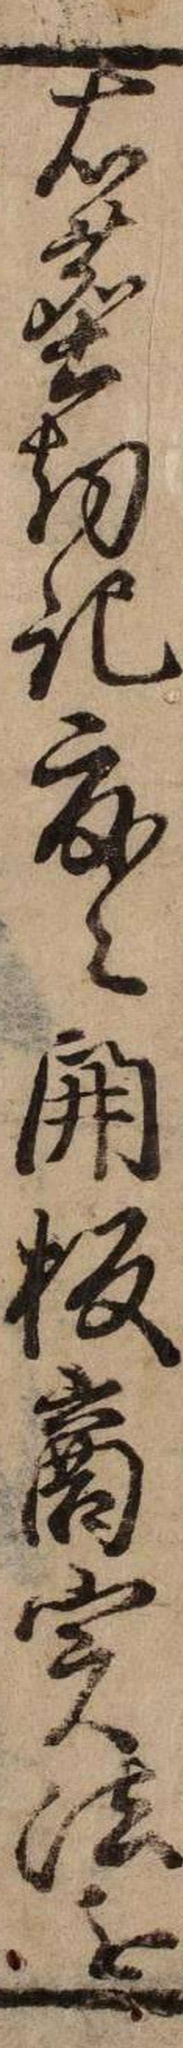右塵劫記度々開板商実法を
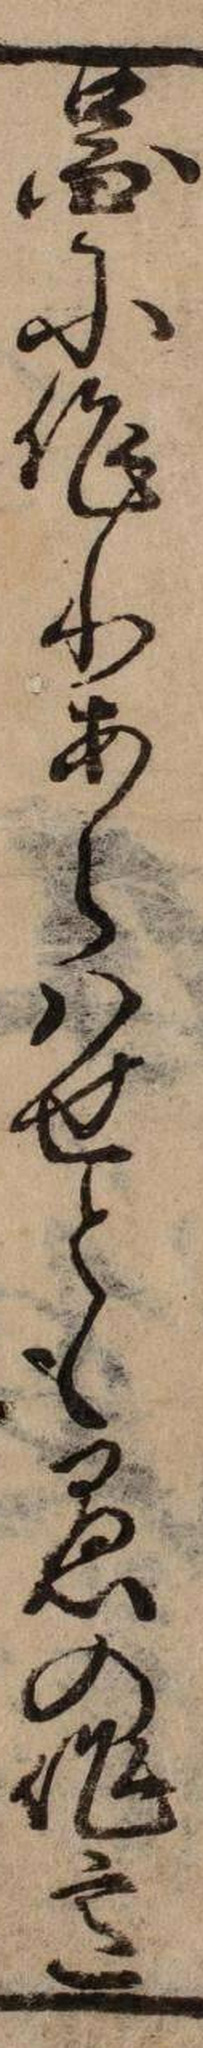圖に作りあらはせとも愚の作意
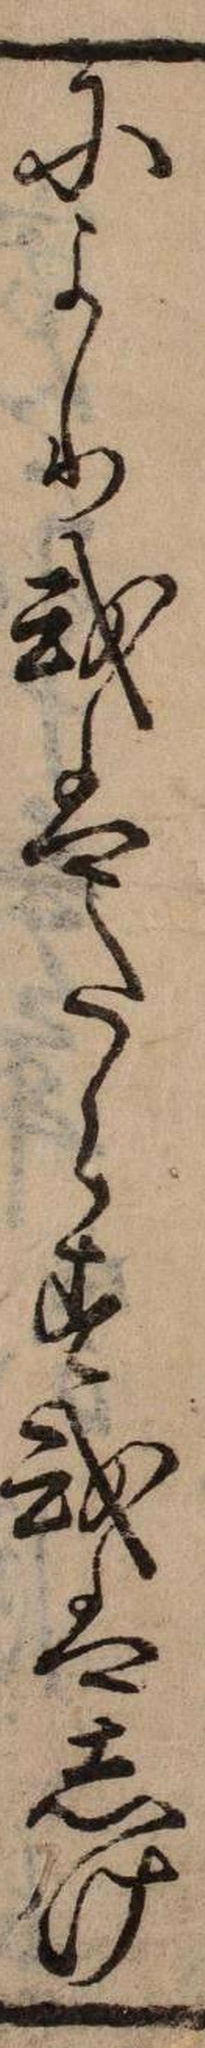により或はたらす或はしけ
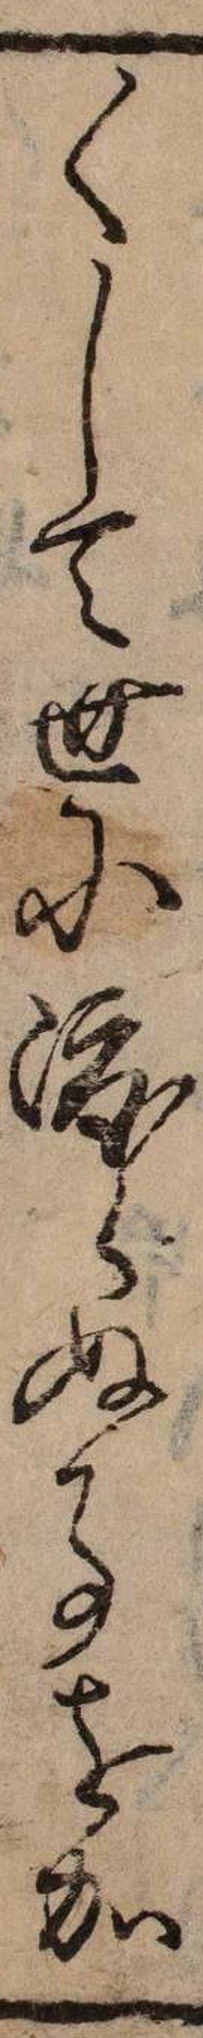くして世に渡らぬ事をか
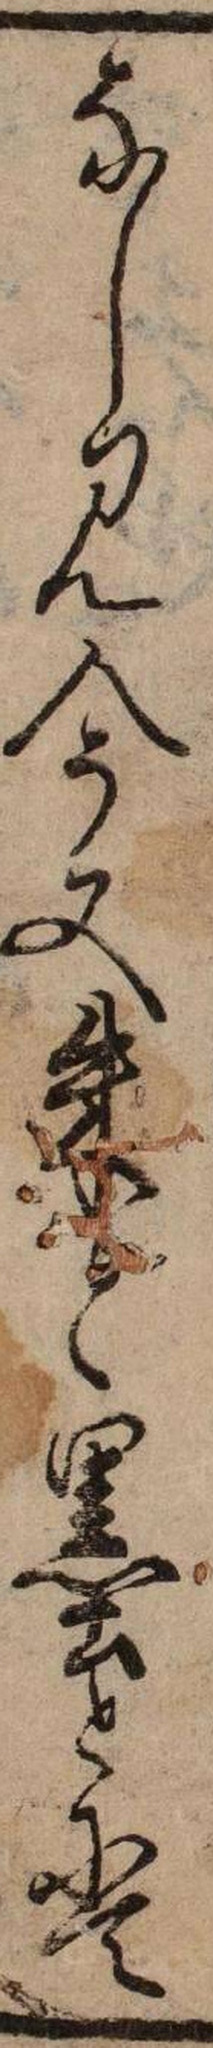なしみ今又朱と墨とにて

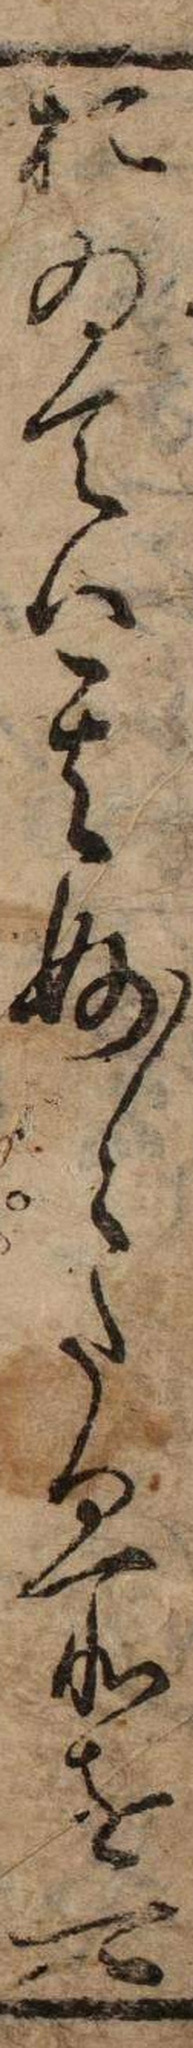おゐては其妙々たる所を可
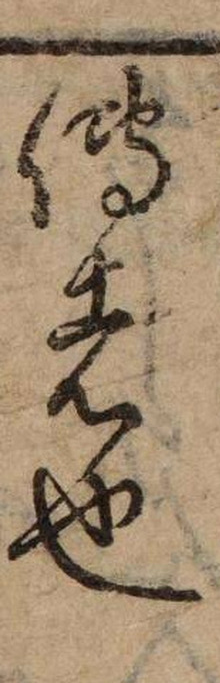伝者也
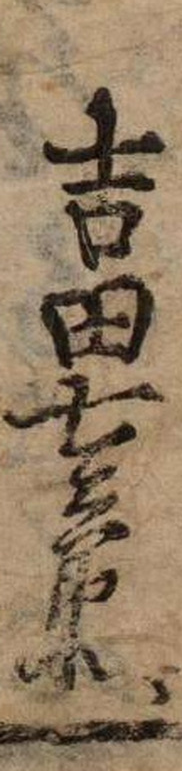吉田七兵衛
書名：ちんかうき　寛永十一
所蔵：京都府立京都学・歴彩館 国文学研究資料館
